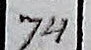74
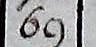69
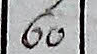60
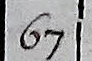67
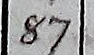87
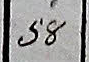58
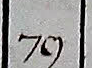79
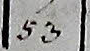53
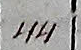44
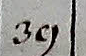39
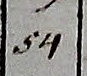54
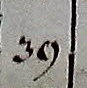39
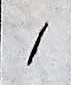1
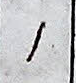1
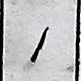1
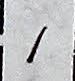1
